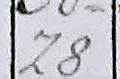28
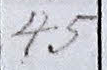45
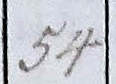54
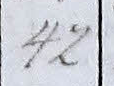42
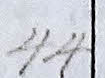44
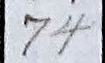74
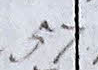57
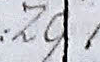29
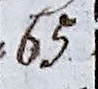65
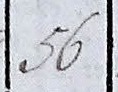56
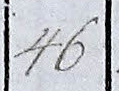46
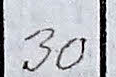30
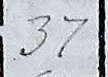37
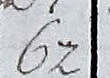62
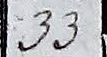33
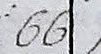66
